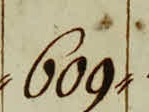609
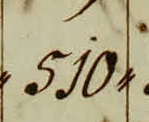510
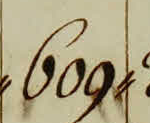609
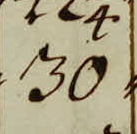30
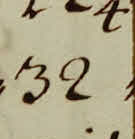32
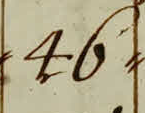46
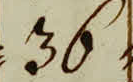36
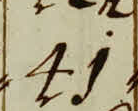41
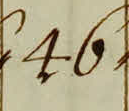46
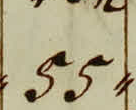55
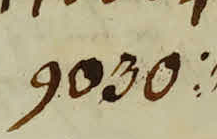9030
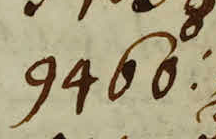9460
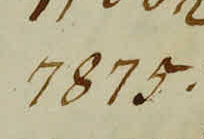7875
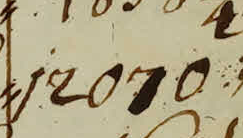12070
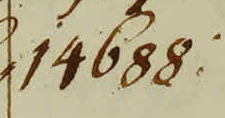14688
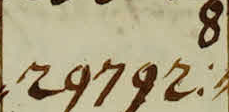29792.
